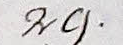29
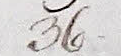36
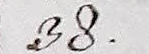38.
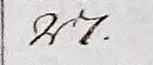27.
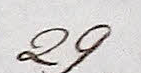29
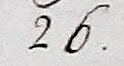26
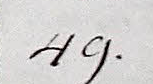49.
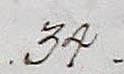34
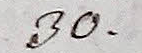30.
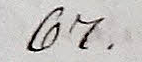67.
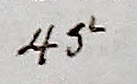45
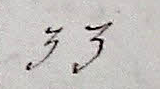33
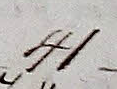41
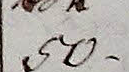50
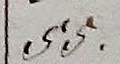55
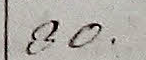30.
